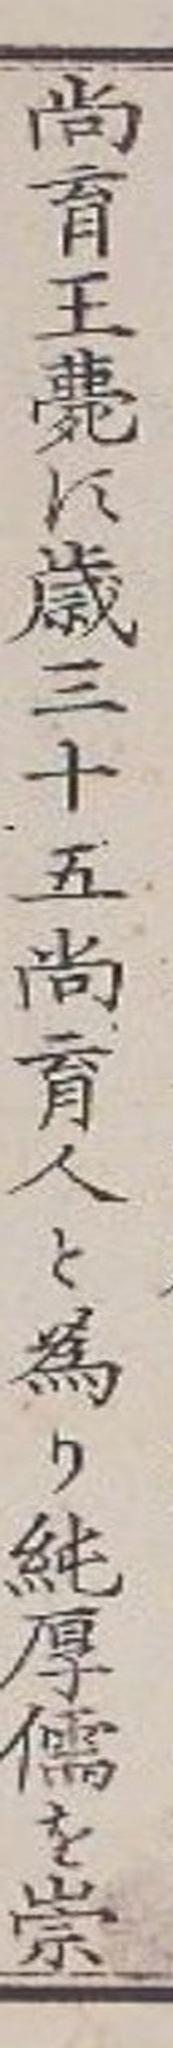尚育王薨す歳三十五尚育人と為り純厚儒を崇
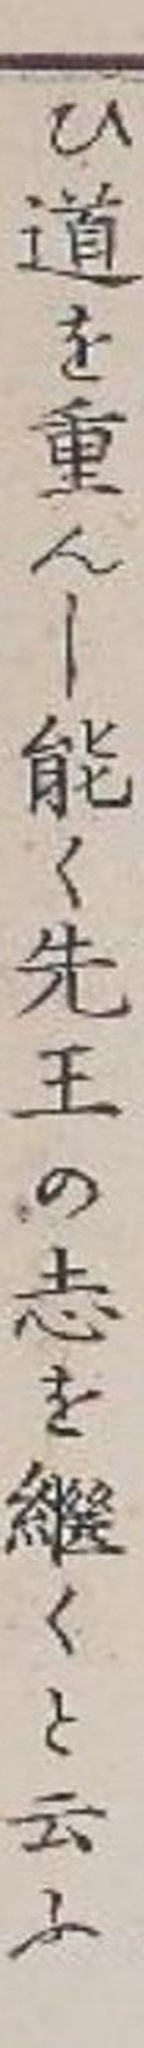ひ道を重んし能く先王の志を継くと云ふ

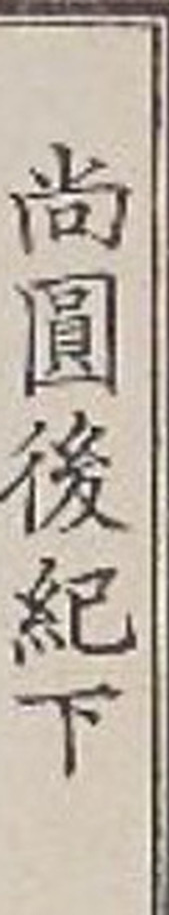尚円後紀下
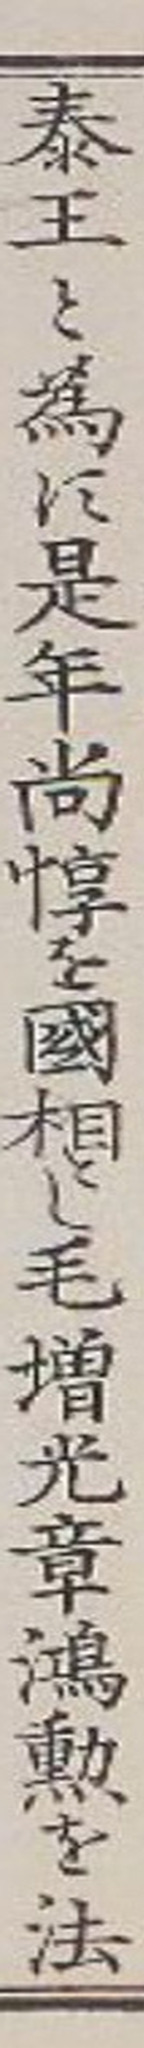泰王と為す是年尚惇を国相とし毛増光章鴻勲を法
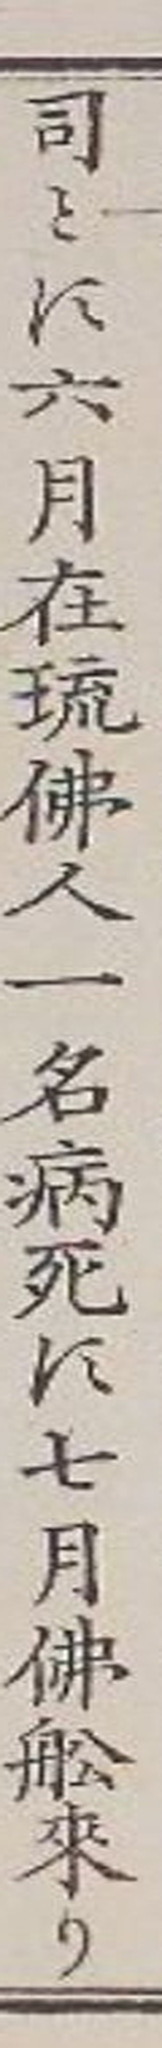司とす六月在琉仏人一命病死す七月仏船来り
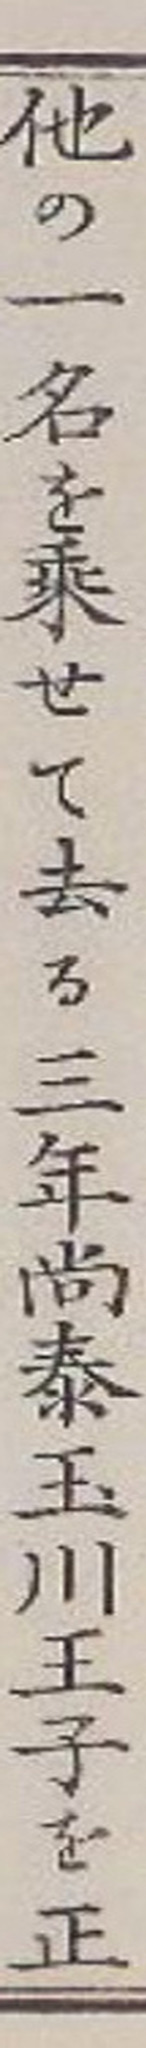他の一名を乗せて去る三年尚泰玉川王子を正
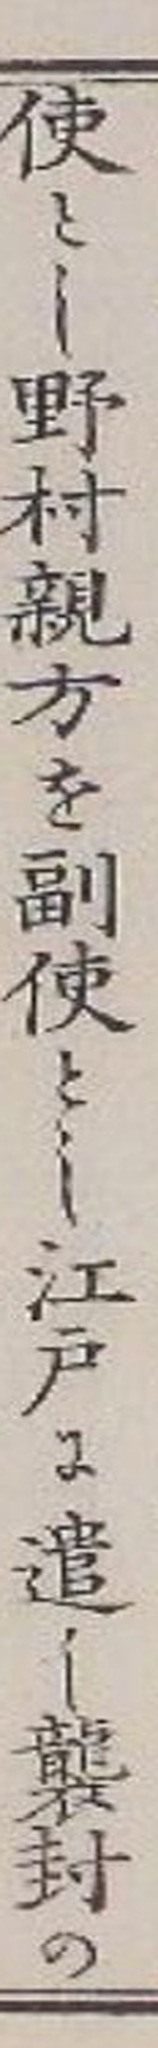使とし野村親方を副使とし江戸に遣し襲封の
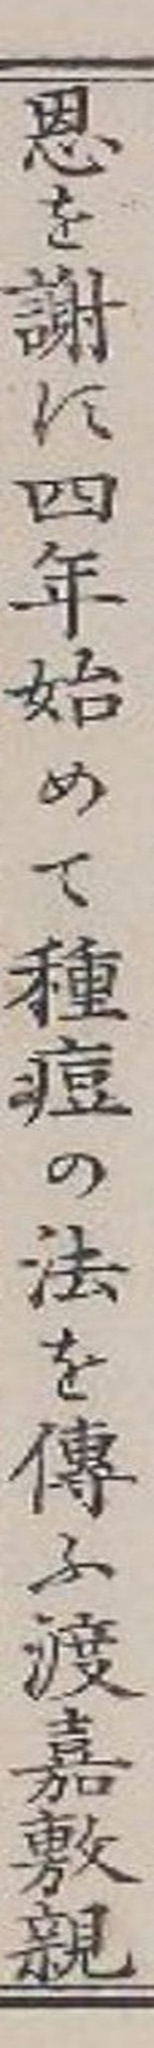恩を謝す四年始めて種痘の法を伝ふ渡嘉敷親

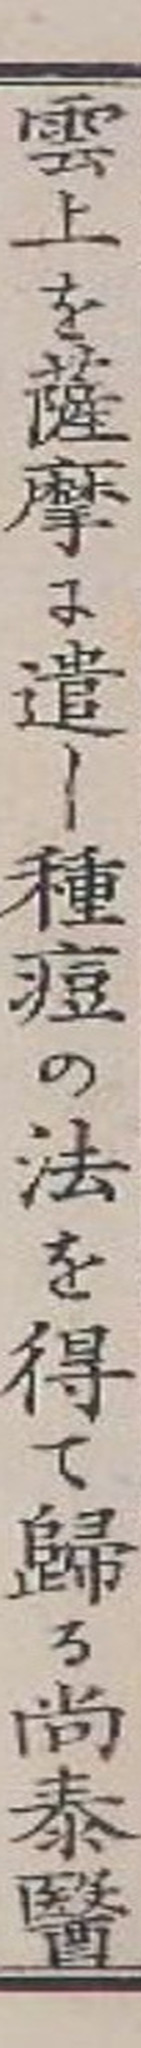雲上を薩摩に遣し種痘の法を得て帰る尚泰医
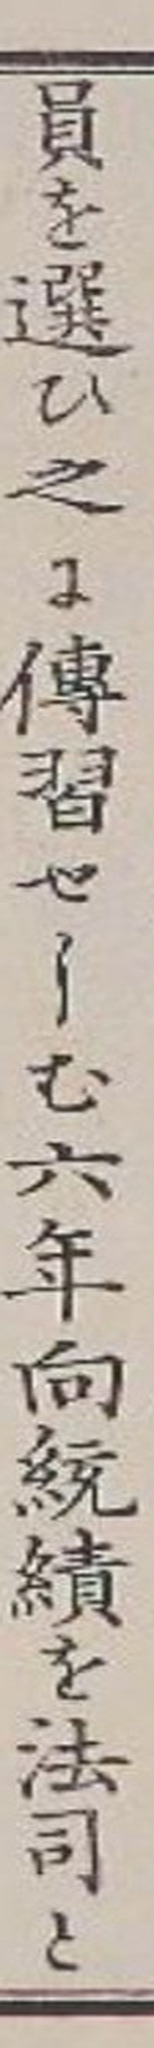員を選ひ之に伝習せしむ六年向統績を法司と
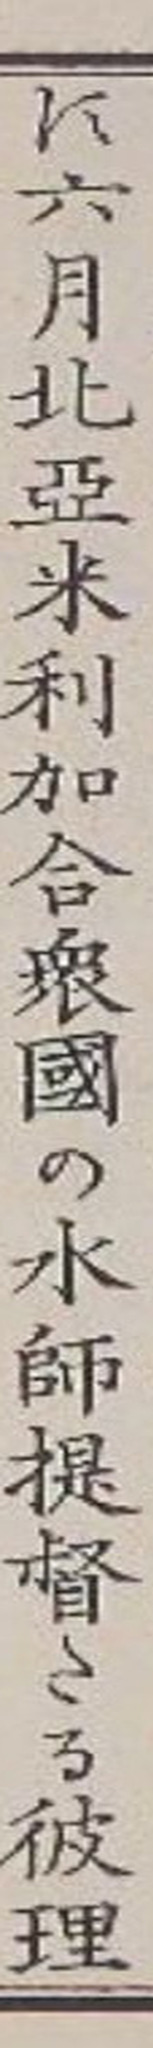す六月北亜米利加合衆国の水師提督たる彼理
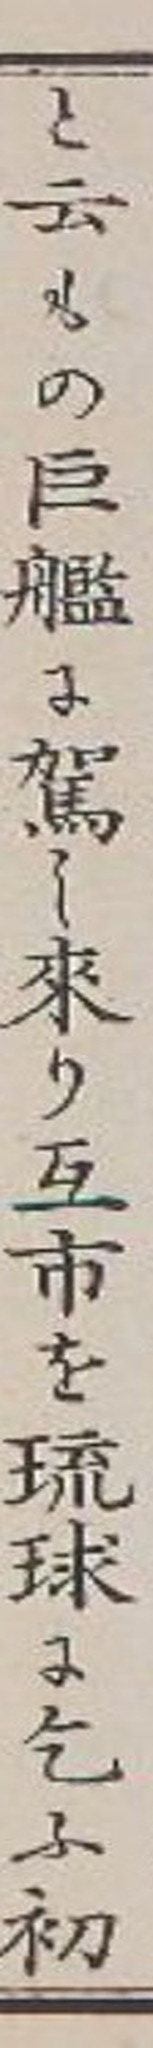と云もの巨艦に駕し来り互市を琉球に乞ふ初
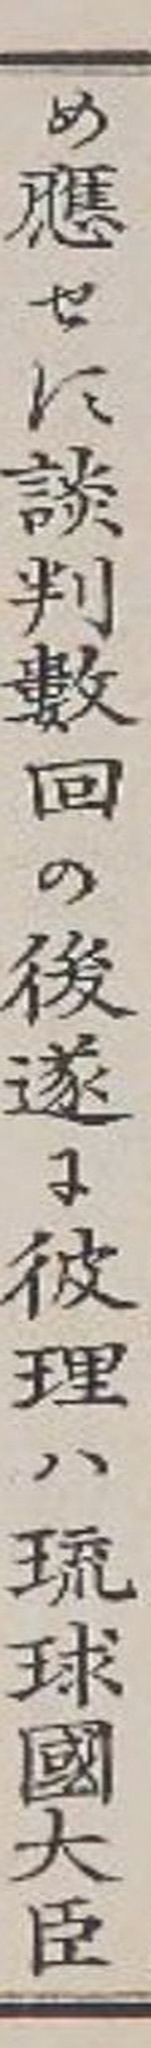め応せす談判数回の後遂に彼理は琉球国大臣
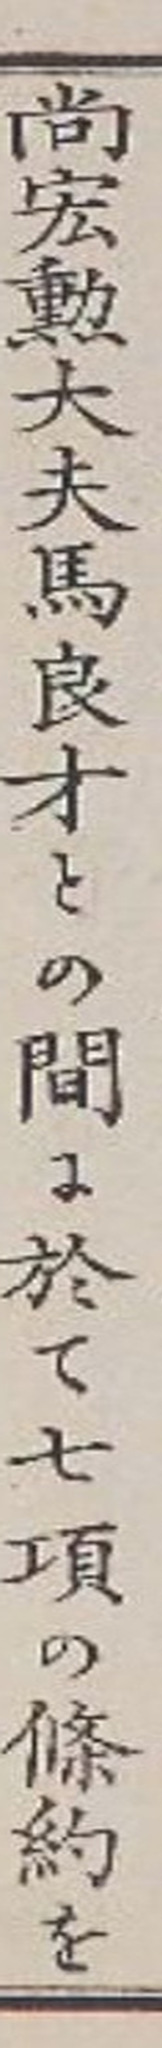尚宏勲大夫馬良才との間に於て七項の条約を
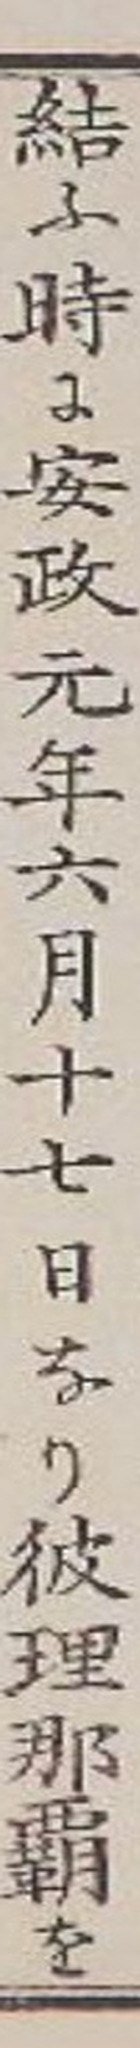結ふ時に安政元年六月十七日なり彼理那覇を
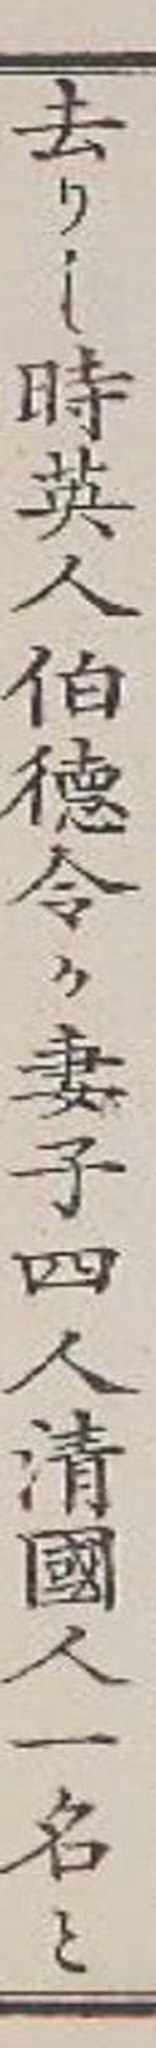去りし時英人伯徳令か妻子四人清国人一名と
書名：南島紀事 下
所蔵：University of the Ryukyus Library
